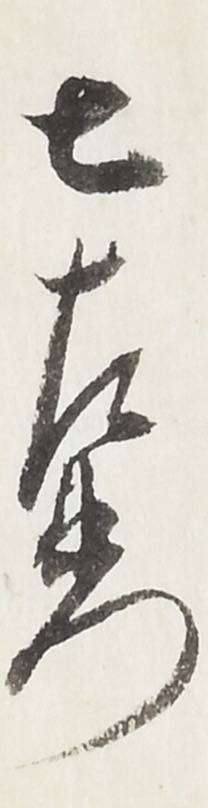又左衛門
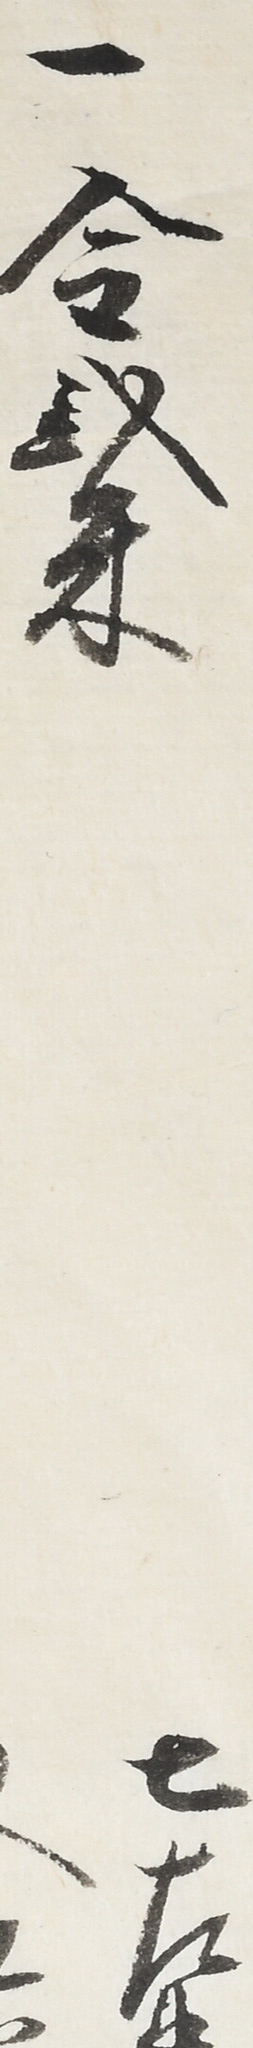一金弐朱七左衛門
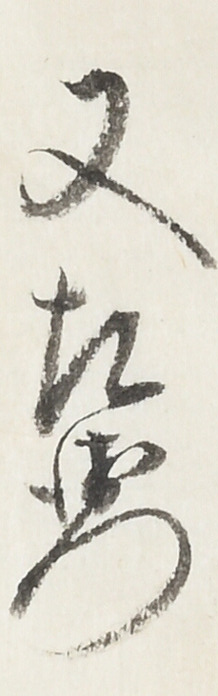又左衛門

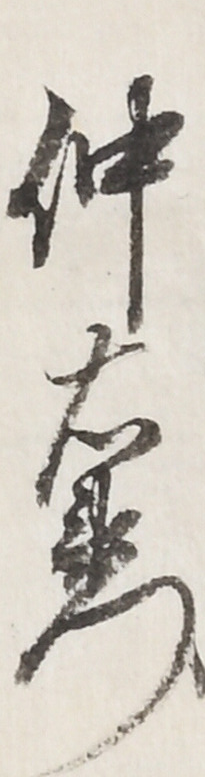直右衛門
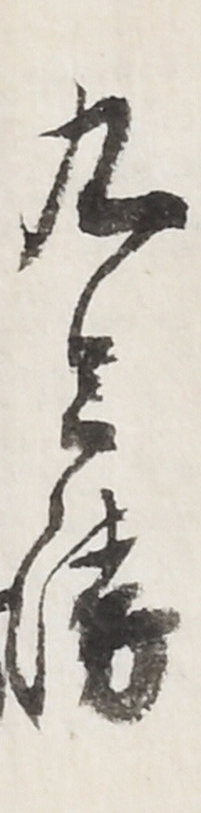九兵衛
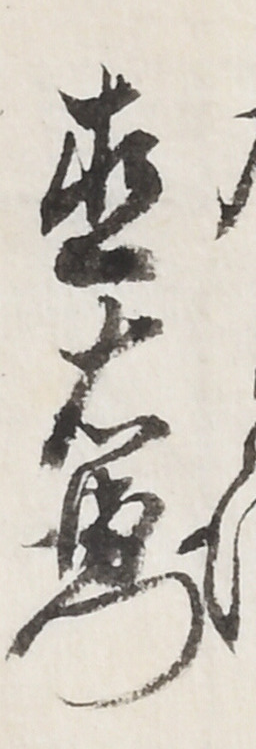直右衛門
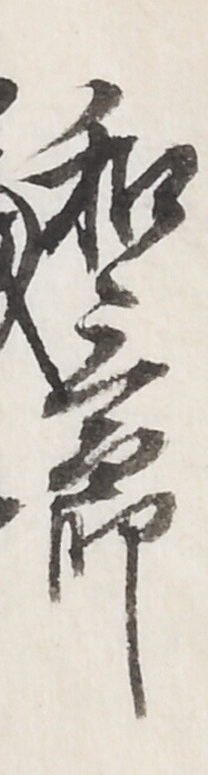和三郎
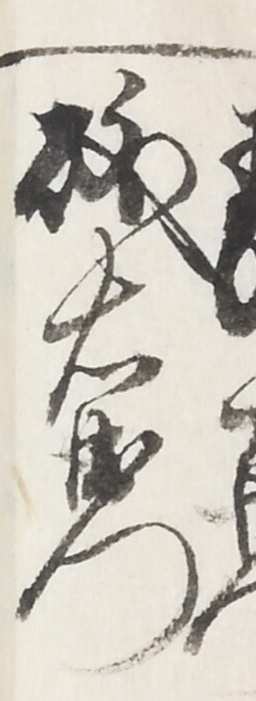直右衛門
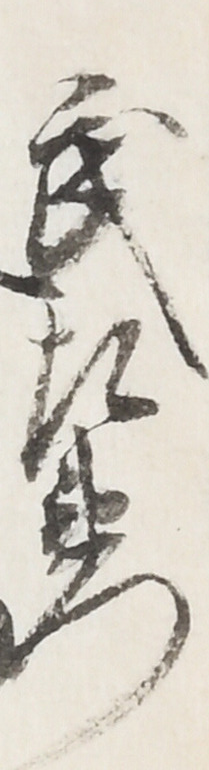源左衛門
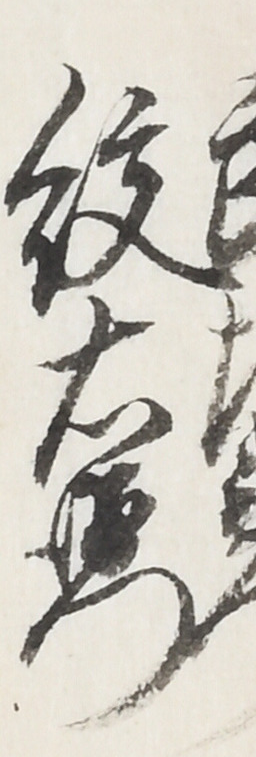紋右衛門
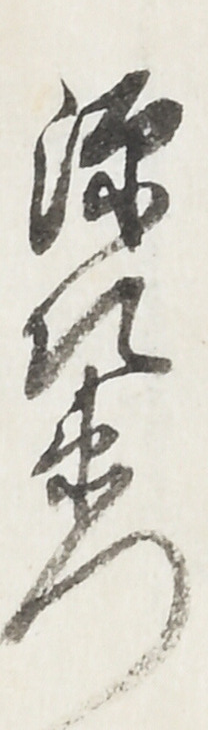源左衛門
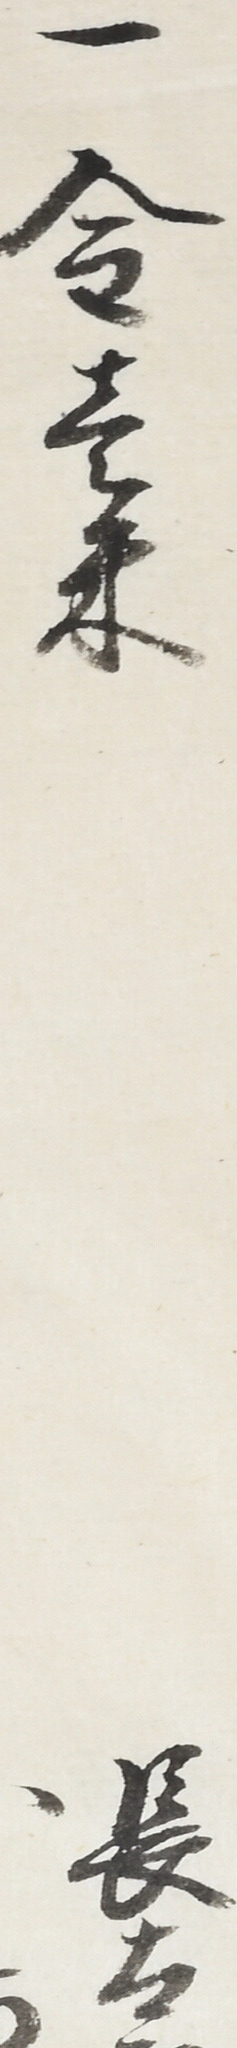一金壱朱長太郎

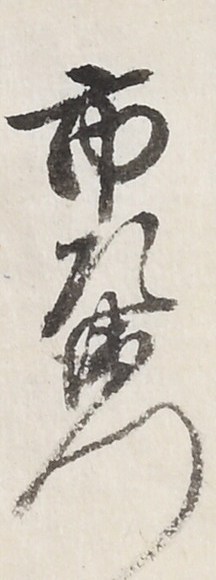要左衛門
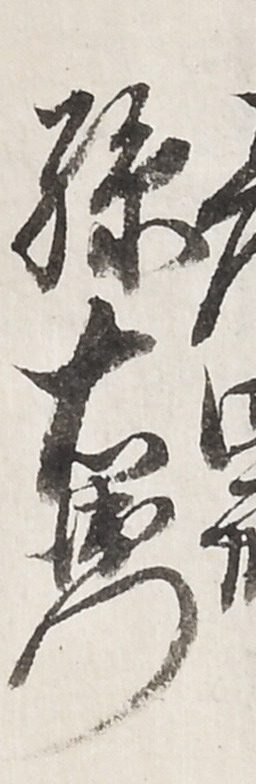孫右衛門
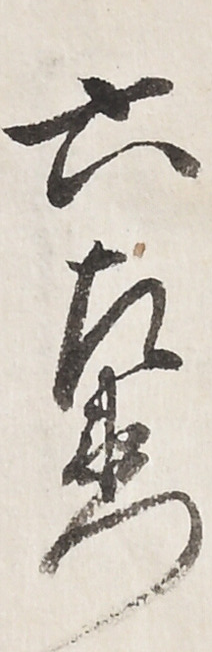要左衛門
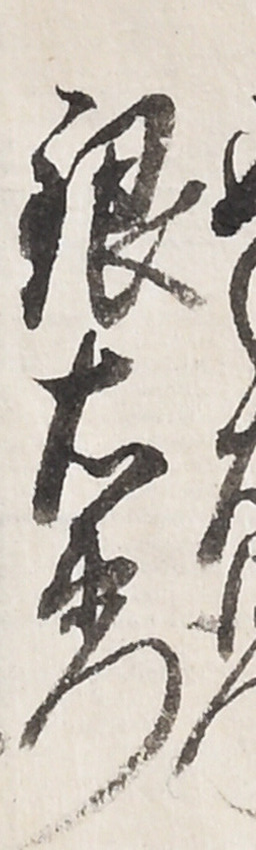銀右衛門
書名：御拝地百五拾年御祝儀献上御目録名前
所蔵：伊那市立高遠町図書館・合同会社AMANE
